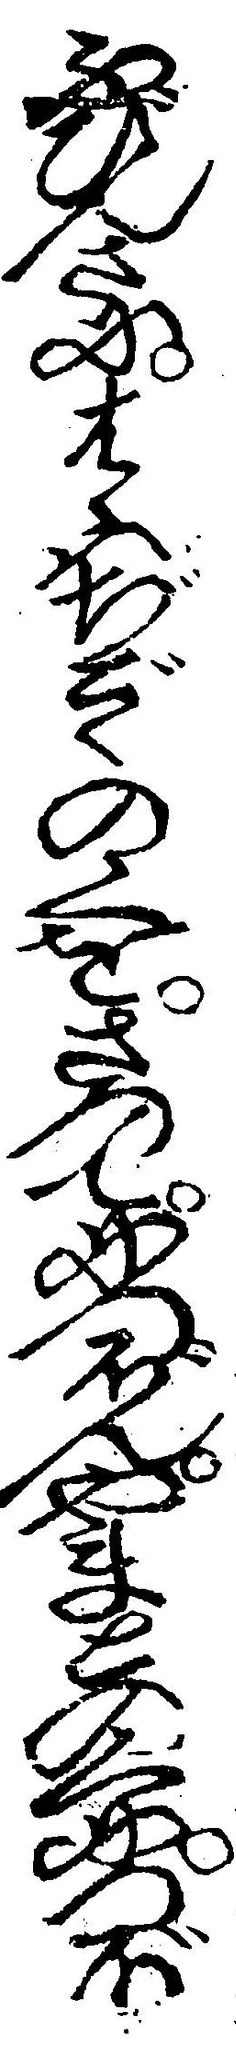ふびんさに。はゝはぢごくのくを。さつて。につぼん。やまとのくに。つぼ
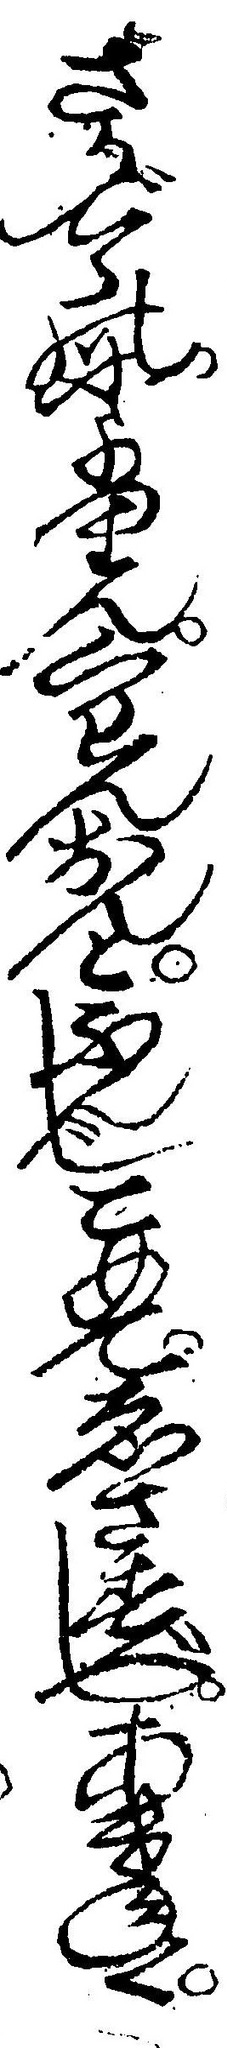さかでらの。によりんくわんおんとふんじこめて。ゑさすべし。あまねく。
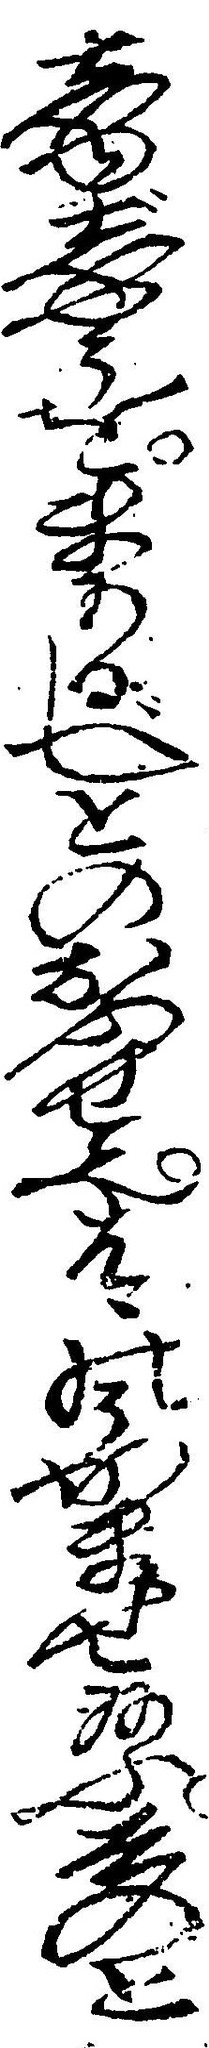しゆじやうを。まもるべしとのおふせ也。はゝのうかませ給ふ。そのと
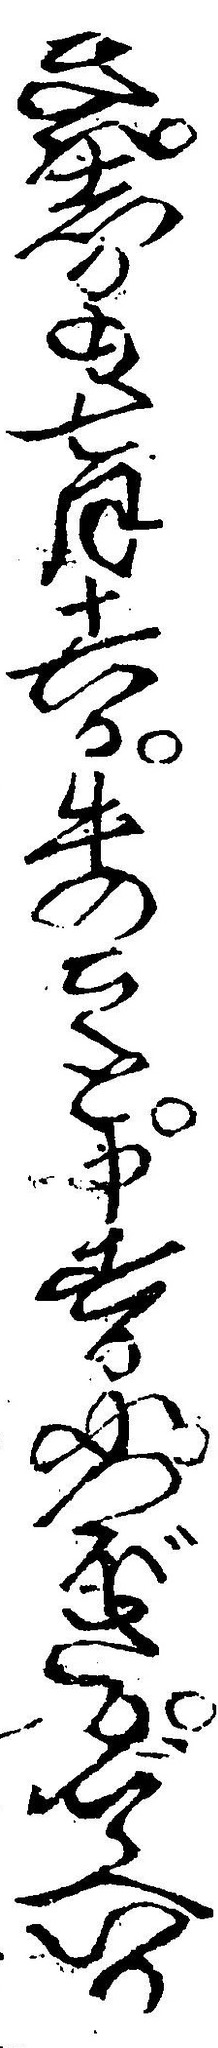きは。しかも七月十六日牛のこくと。申するに。つぼさか。でらへいり
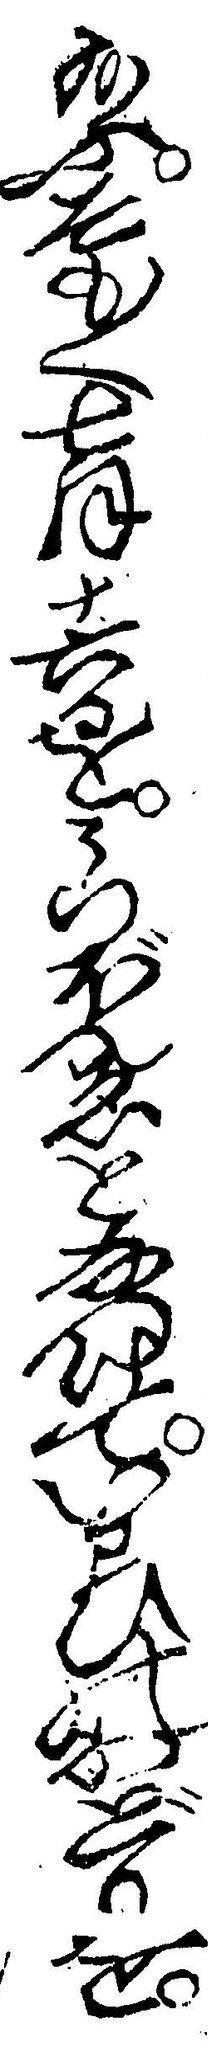給ふ。そも〳〵七月十六日を。うらぼんゑとなつけて。いわひのおどりを。
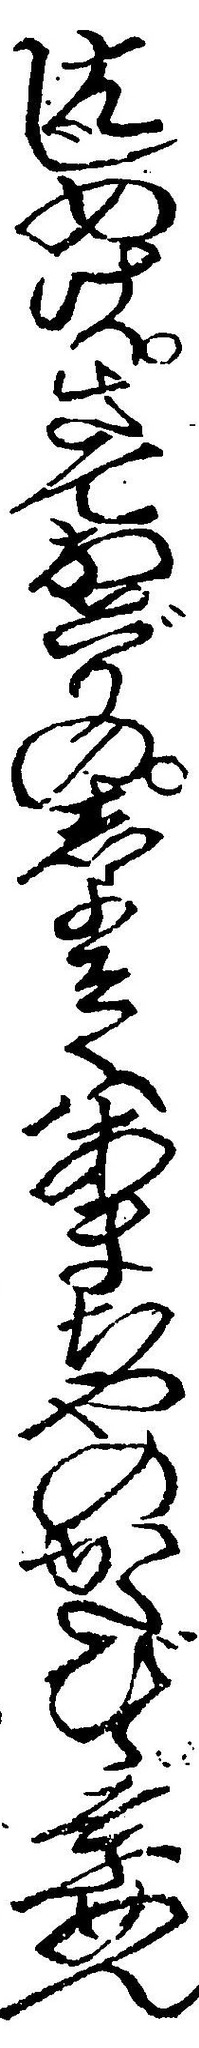はじめける。さておどりの。しよそくはあまちやのかたびら。そふめん
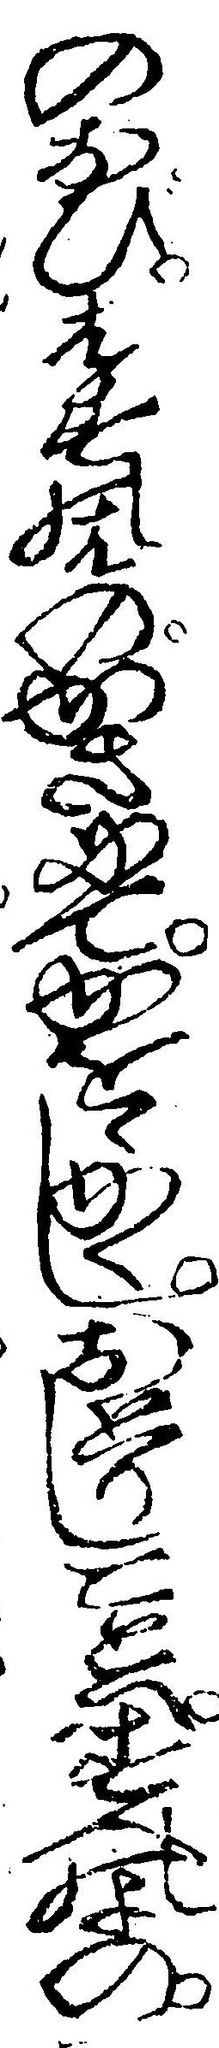のおび。はすのはの。かさにて。かをゝかくし。おとりしことは。すへのよの。
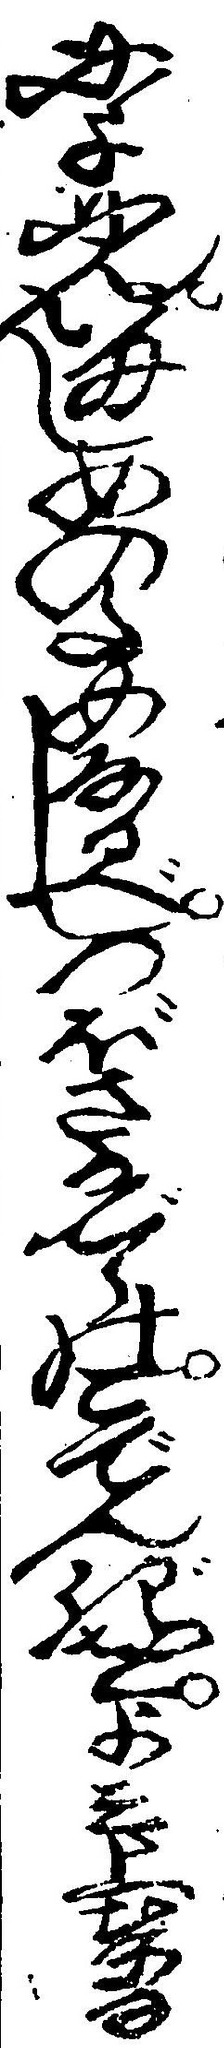によにん。いましめのためなるべし。つぼさかでらの。こでんぎを。よみ上奉る
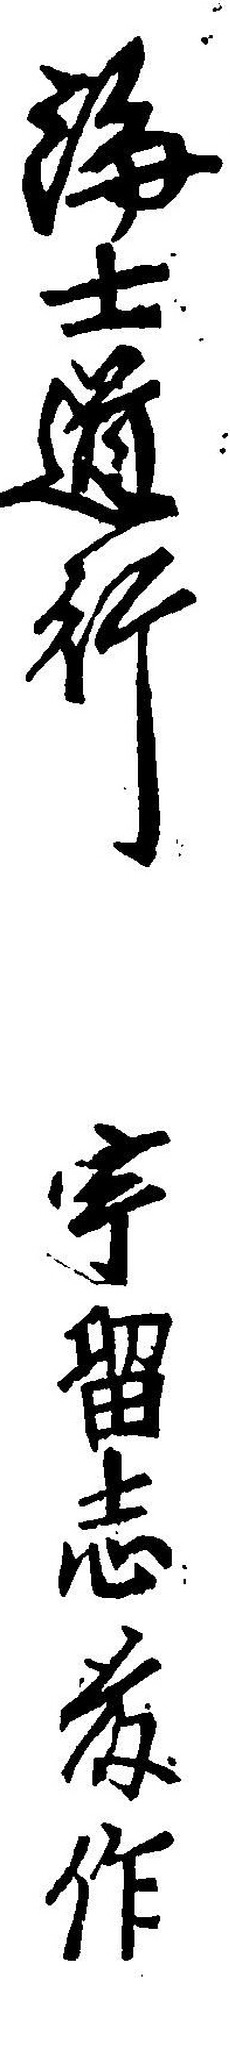浄土道行宇留志藤作
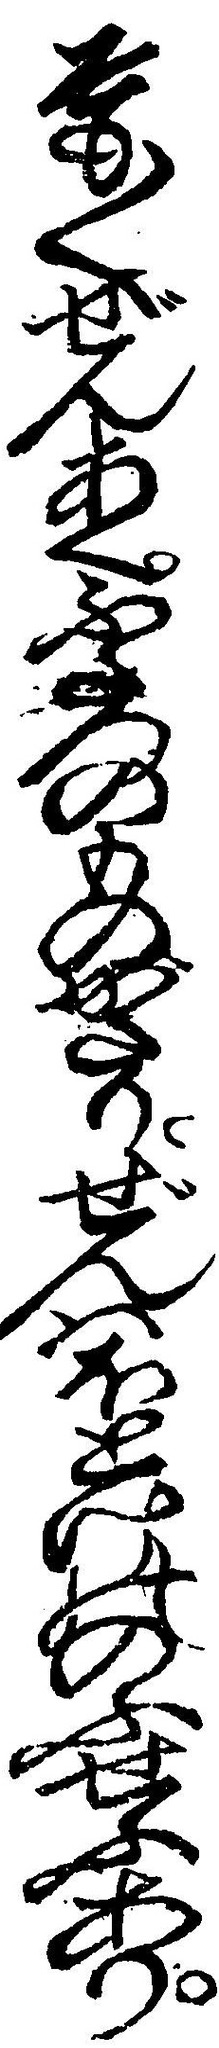そも〳〵ぜんあく。ふたつのものがたり。ぜんはほとけのふせふあり。
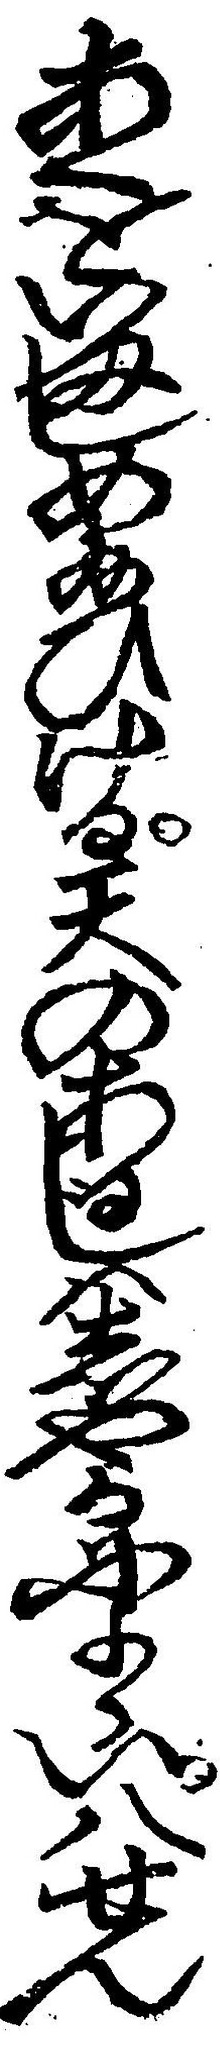あくをいましめ給ひける。天のあるしはしやかによらい。八せん
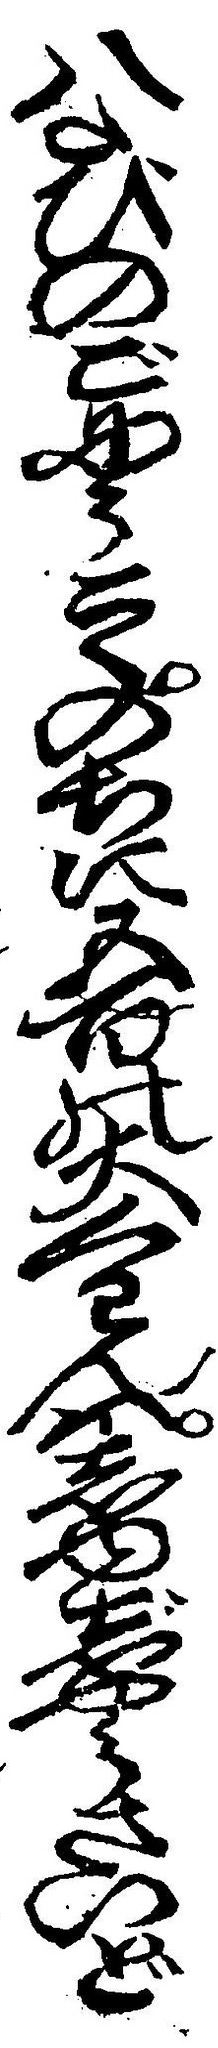八たびのごにうこく。のちに五百の大くわんは。しゆじやうさいど
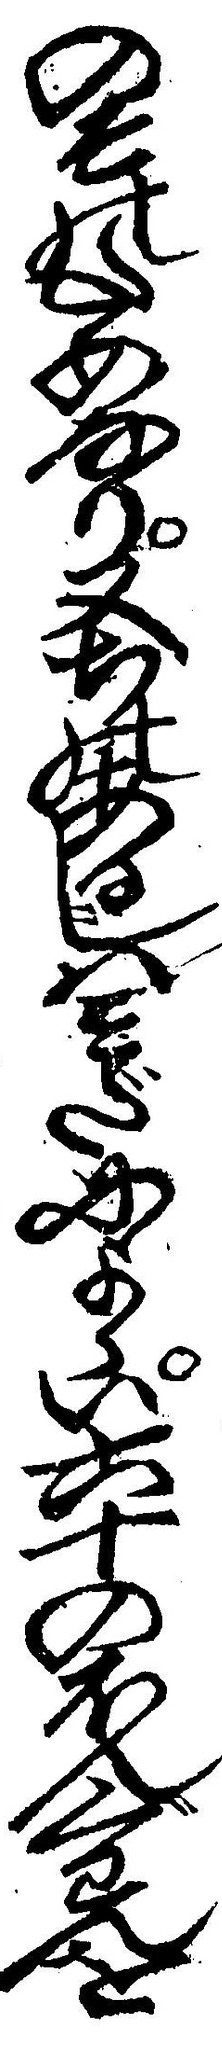のそのためなり。又ちのあるしはみだによらい。六十のほんぐわんを
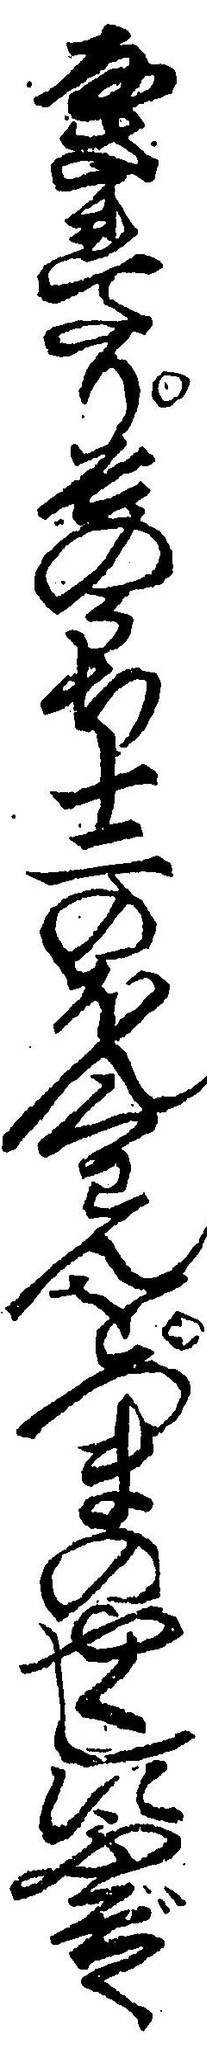なされたり。そのうち十二のほんくわんを。つまのやくしにふぞく
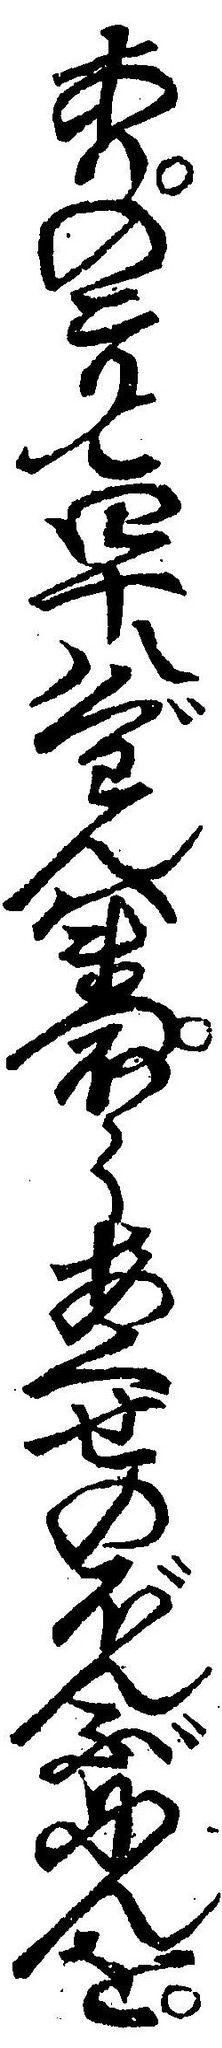あり。のこりて四十八ぐわんはまつ。ほうあくせのぼんぶにんを。
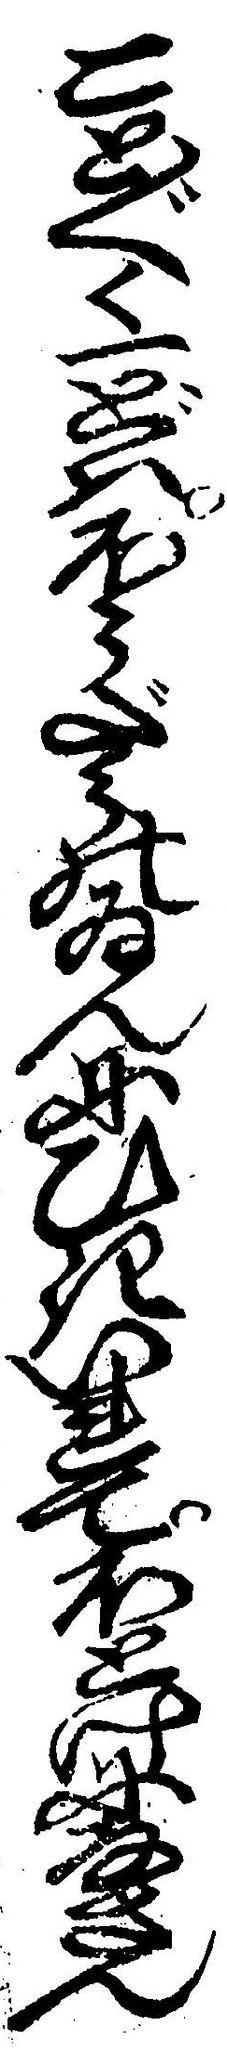こと〴〵く一どは。ほうだうのゐんにひきいれて。ほとけになさん
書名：目連尊者地獄めくり / 宇留藤太夫正本
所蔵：東京大学総合図書館 General Library in the University of Tokyo, JAPAN
